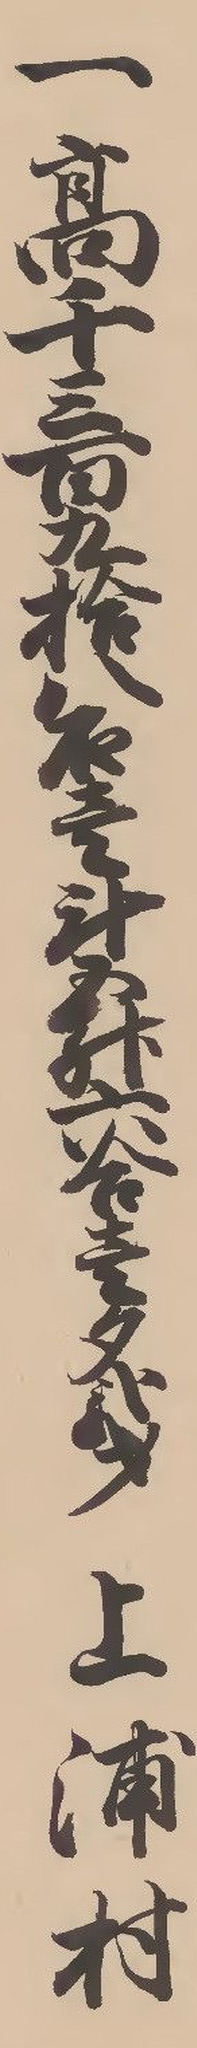一高千三百九拾八石壱斗五升六合壱勺弐才上浦村

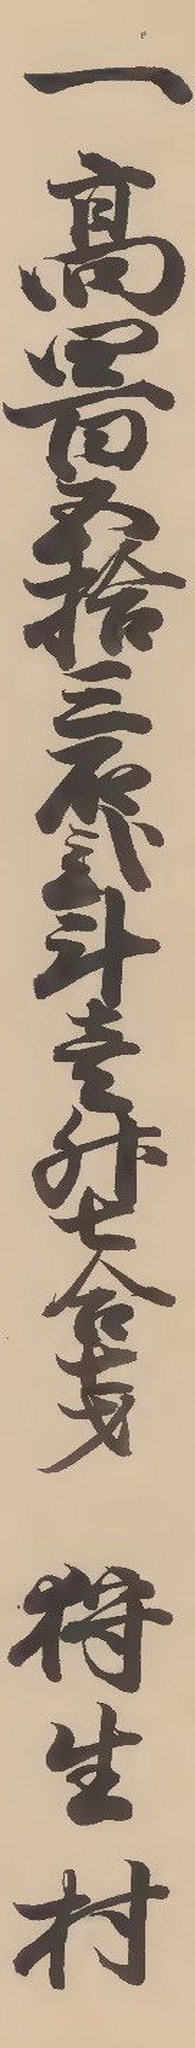一高四百五拾三石弐斗壱升七合七才狩生村
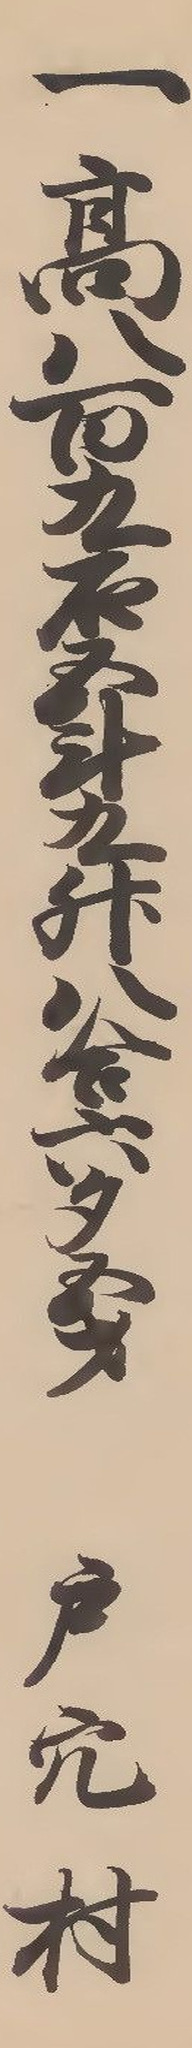一高八百九石五斗九升合八合六勺五才戸穴村
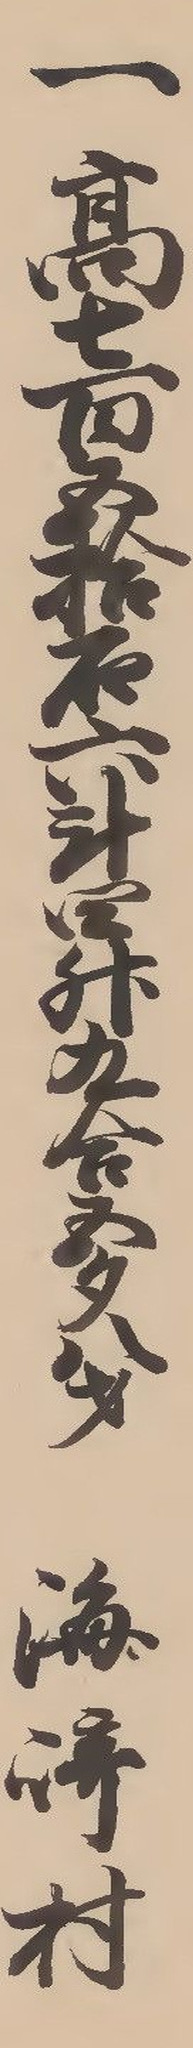一高七百五拾石六斗四升九合五勺八才海崎村
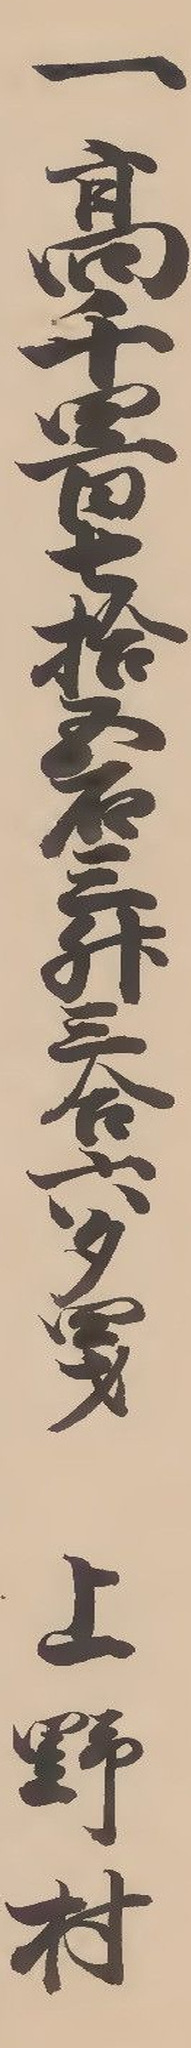一高千四百七拾五石三升三合六勺四才上野村
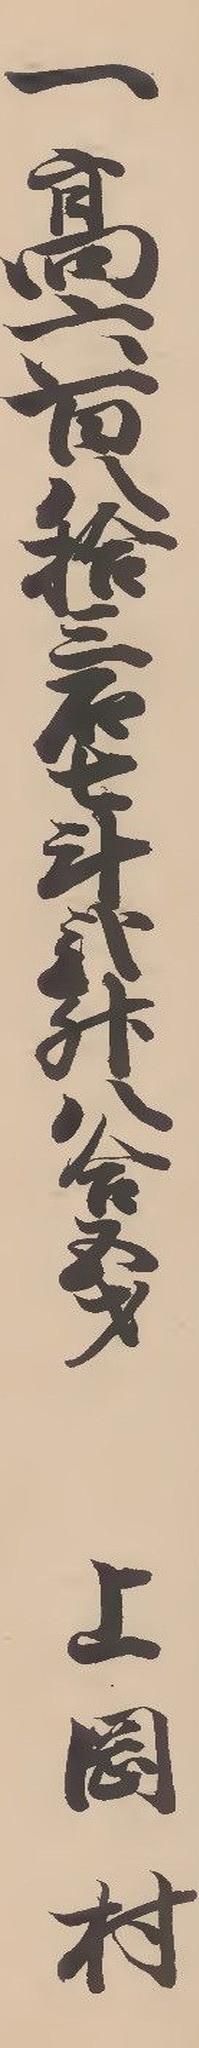一高六百八拾三石七斗弐升八合五才上岡村
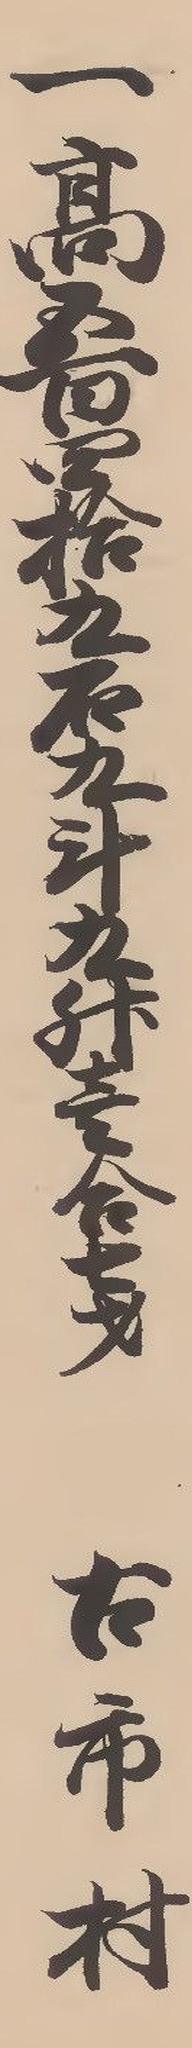一高五百四拾九石九斗九升壱合七才古市村
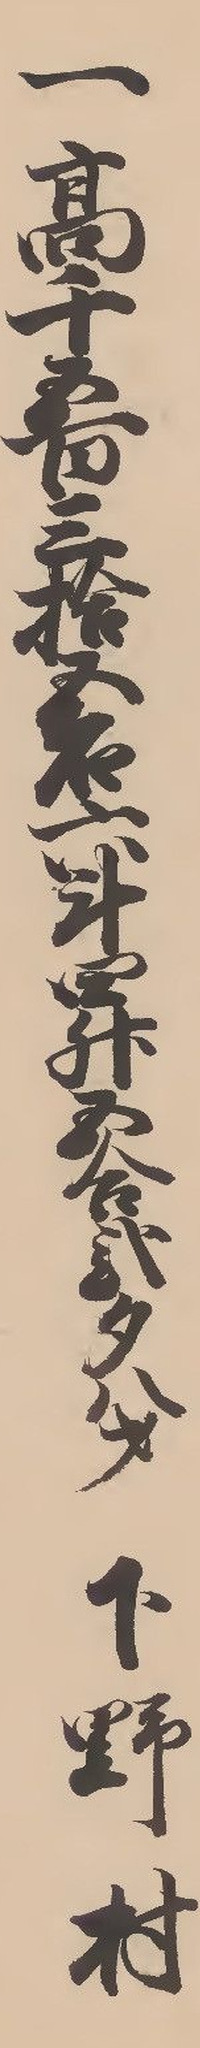一高千五百三拾五石六斗四升五合弐勺八才下野村
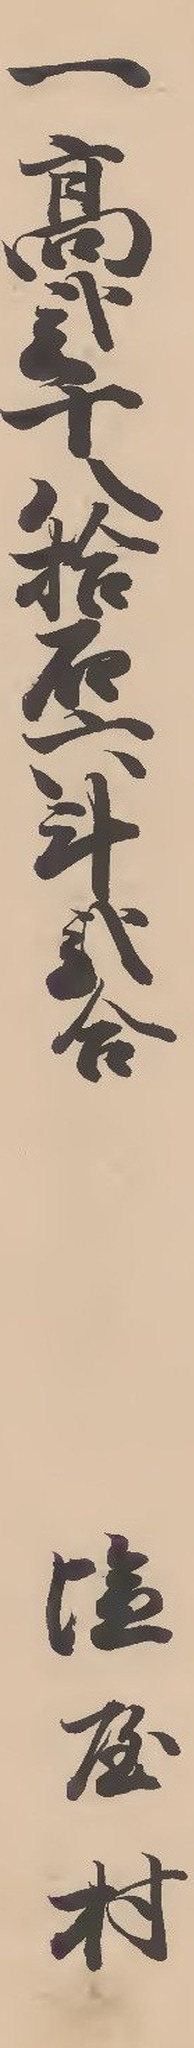一高弐千八拾石六斗弐合塩屋村

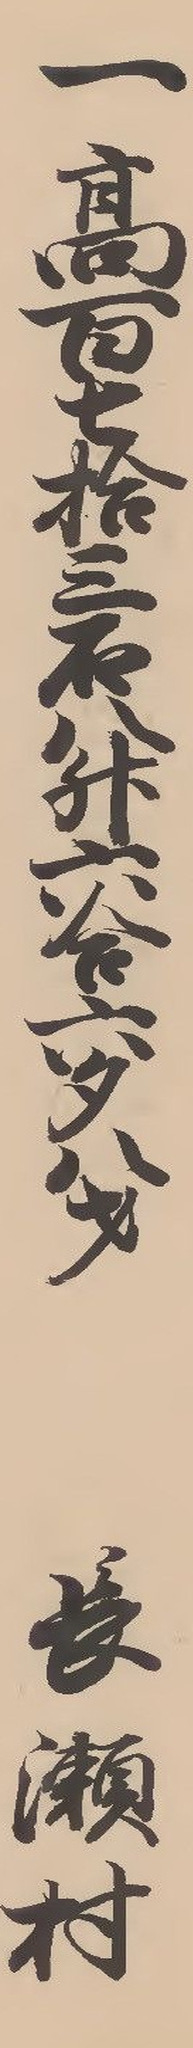一高百七拾三石八升六合六勺八才長瀬村
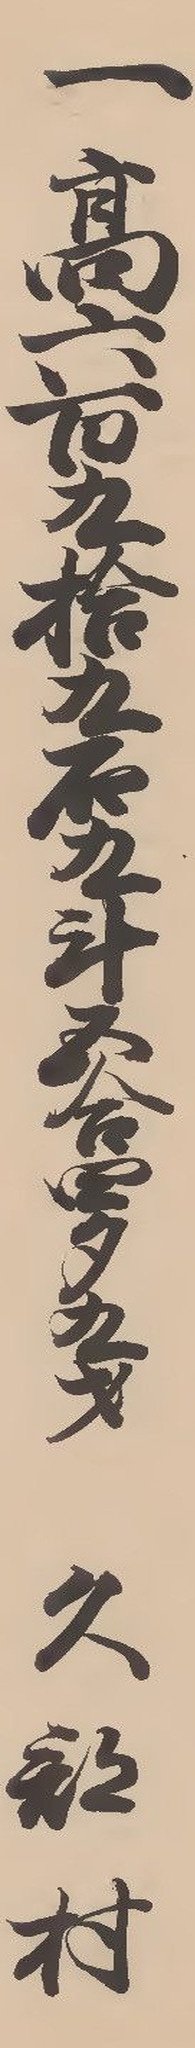一高六百九拾九石九斗五合四勺九才久部村
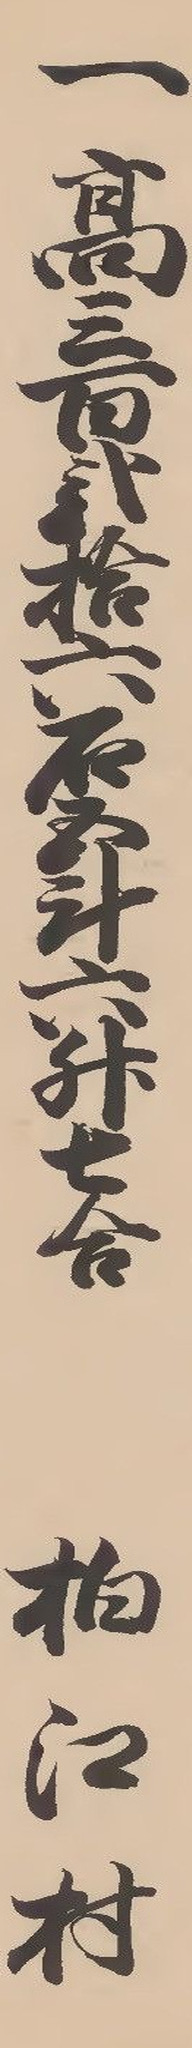一高三百弐拾六石五斗六升七合柏江村
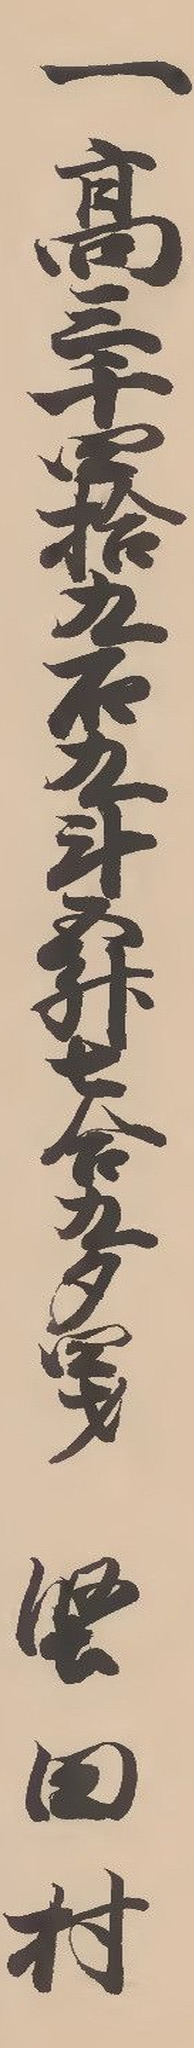一高三千四拾九石九斗五升七合九勺四才堅田村
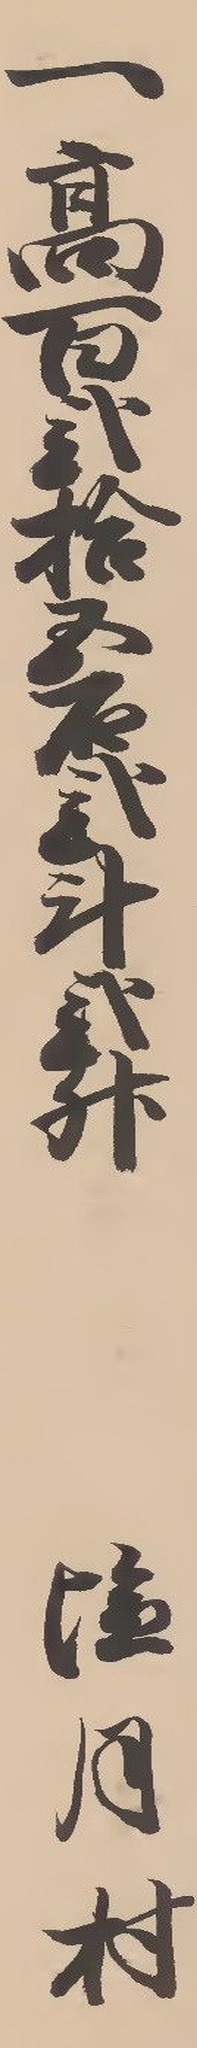一高百弐拾五石弐斗弐升塩月村
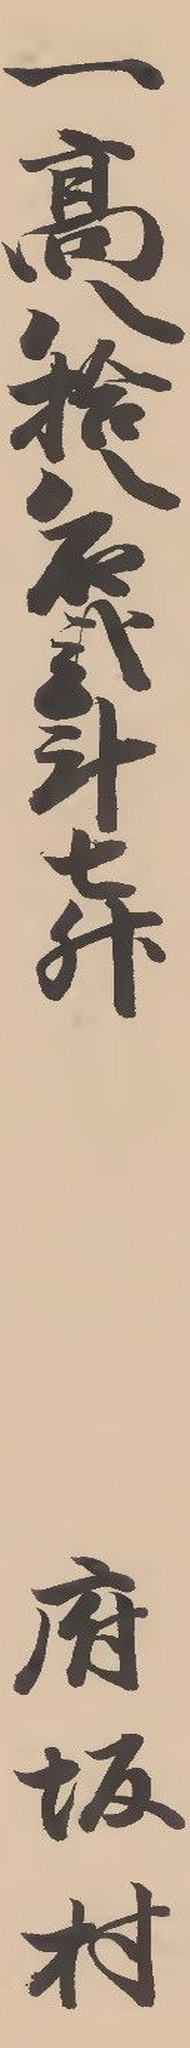一高八拾八石弐斗七升府坂村
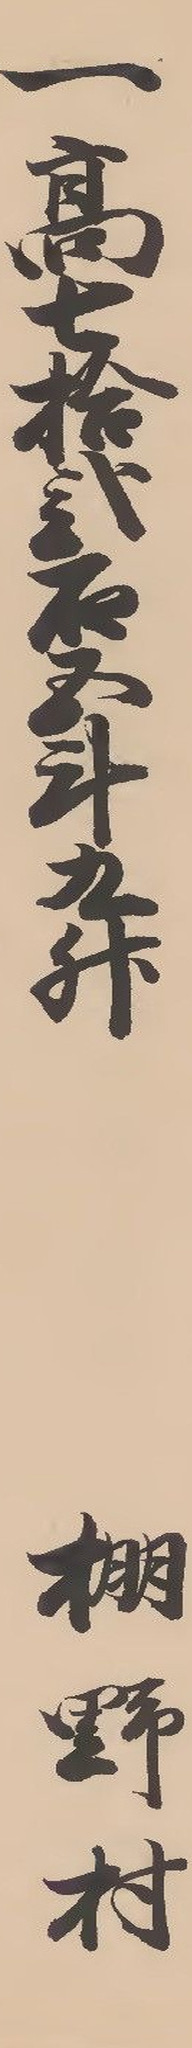一高七拾弐石五斗九升棚野村
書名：豊後国郷帳
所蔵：国立公文書館 National Archives of Japan
